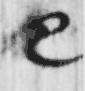巳
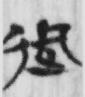○（卜）
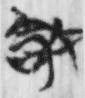○（令）
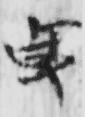史
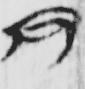尹
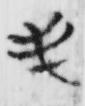毛
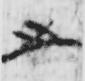之
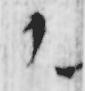人
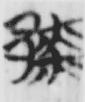郯
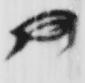尹
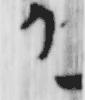人
